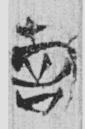○（慎）
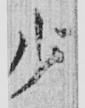少（小）
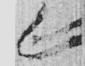㠯（以）
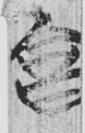○（答）
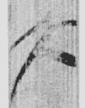大
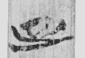疋（疏）
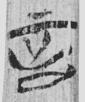言
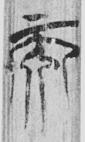而
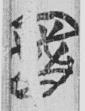○（密）
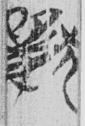獸（守）
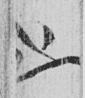之
